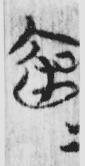竆身
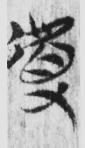○（且）
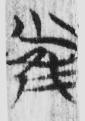雀（爵）
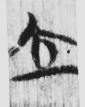立（位）
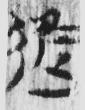○（遲）
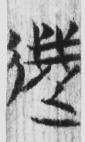踐
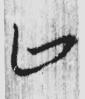㠯（以）
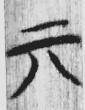亓（其）
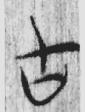古（故）
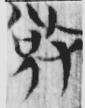敓
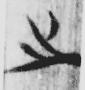之
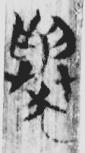○（舉）
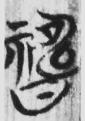禱
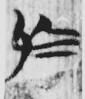於
